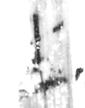生
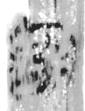○（陰）
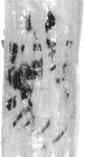陽
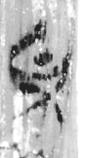夬
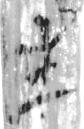生
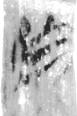於
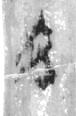丑
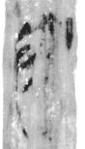即
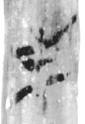生
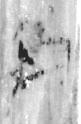於
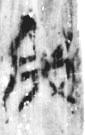寅
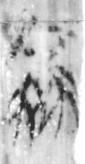衰
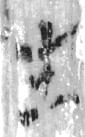生
